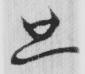也
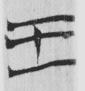王
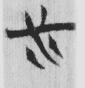必
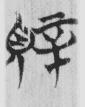親
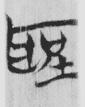聖
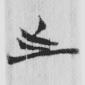之
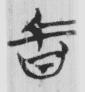旨
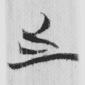之
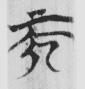而
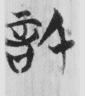信
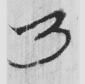乃
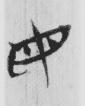母
